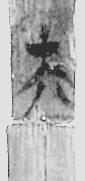{十六}
